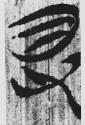○（得）
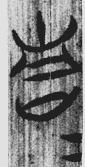青
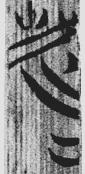老
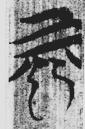而
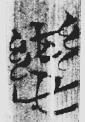○（慈）
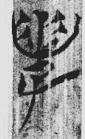○（幼）
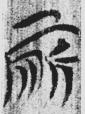所
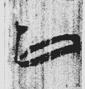㠯（以）
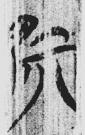凥（處）
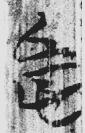○（仁）
